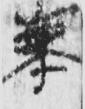東
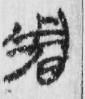周
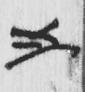之
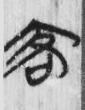客
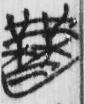○（許）
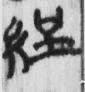○（盈）
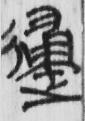歸
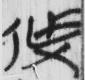{尸拃}（胙）
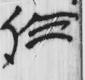於
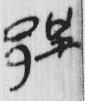郢
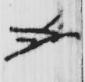之
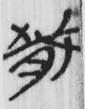歲（歲）
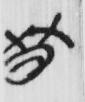冬（冬）
